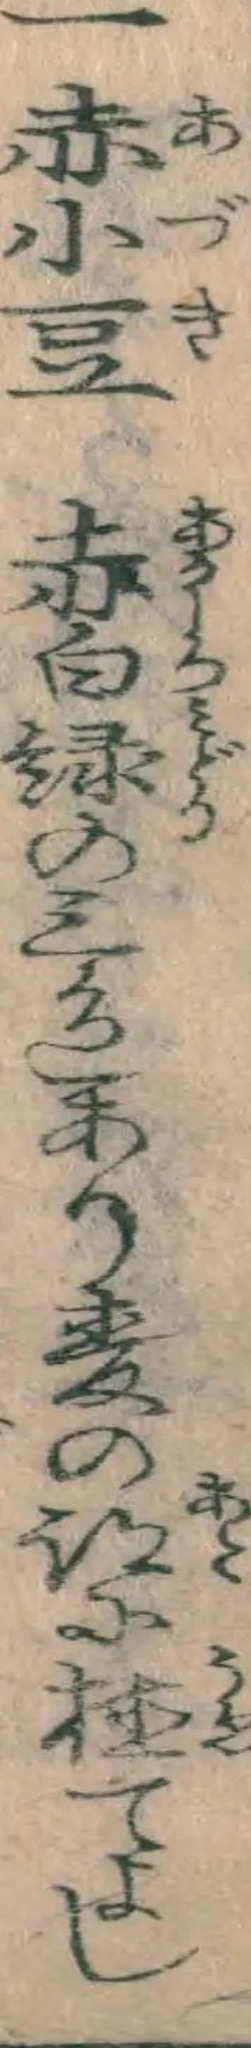一赤小豆赤白緑の三色あり麦の跡に植てよし
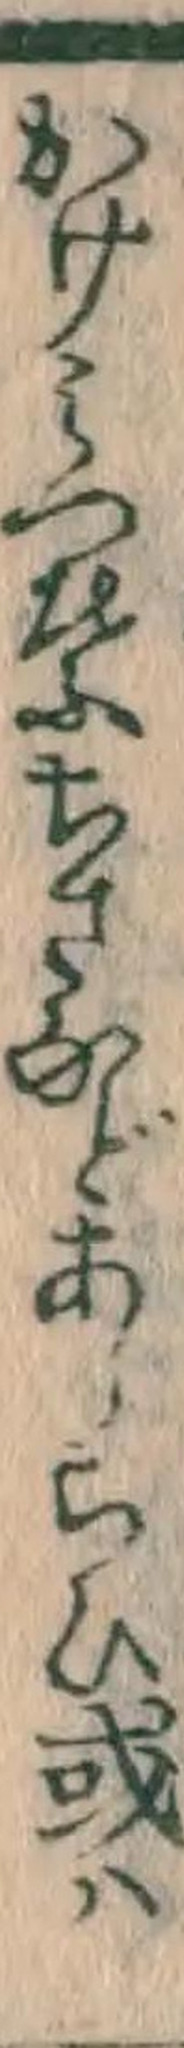かけみつ葉ちさなどあしらひ或は
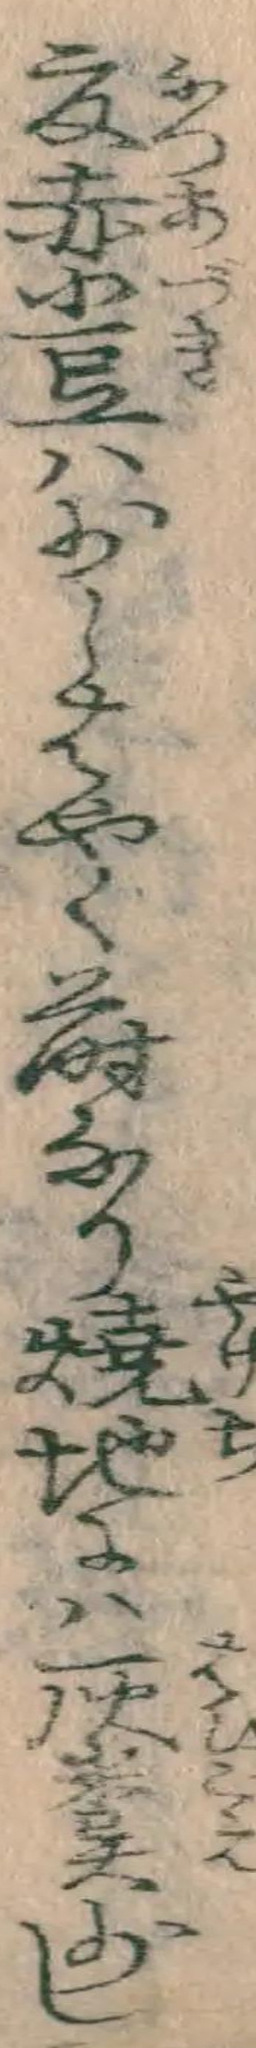夏赤小豆は少しはやく蒔なり焼地には灰糞少し
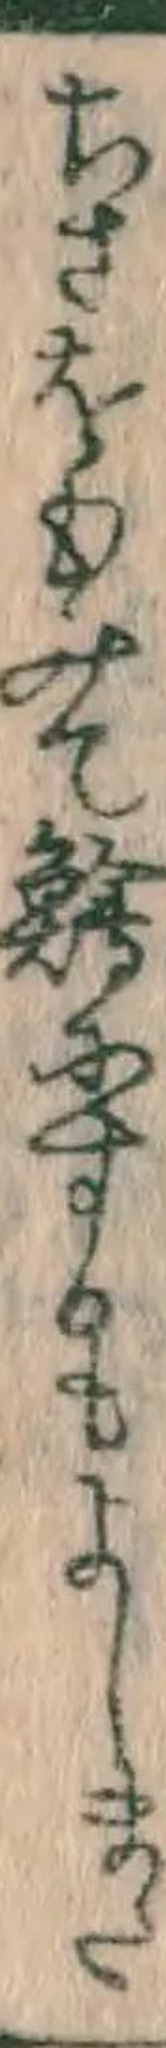ちさをもみて鱠にするもよしまた
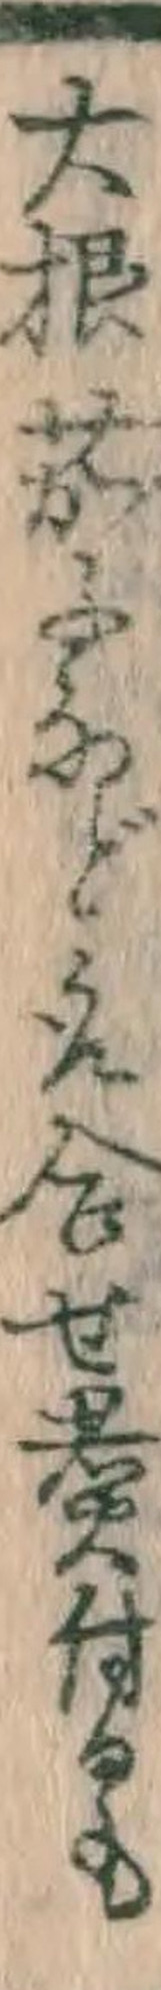大根茄子など取合せ煮付るも
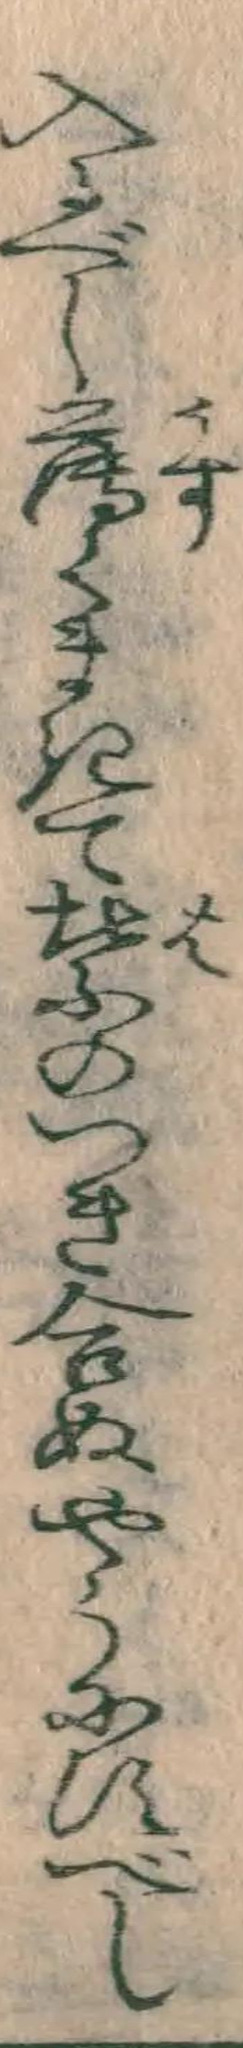入るべし薄くまきて葉のつき合ぬやうにすべし
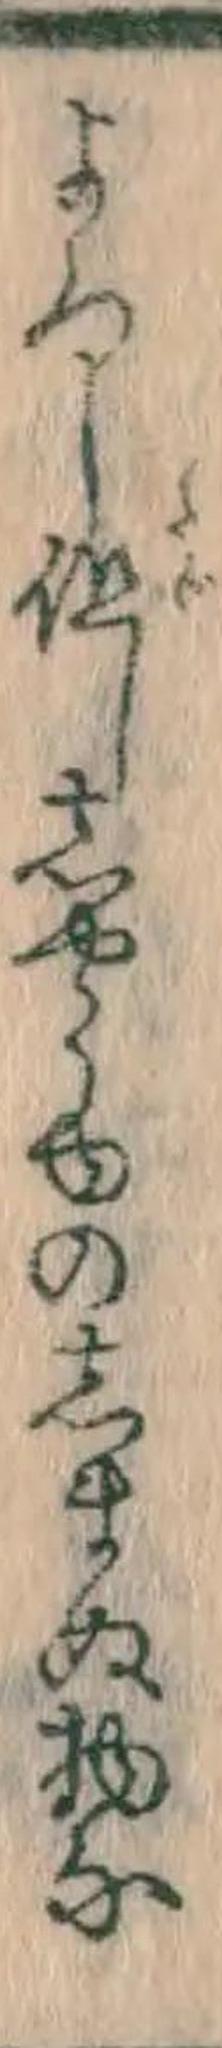よろし但ししやうゆのしまぬ物な
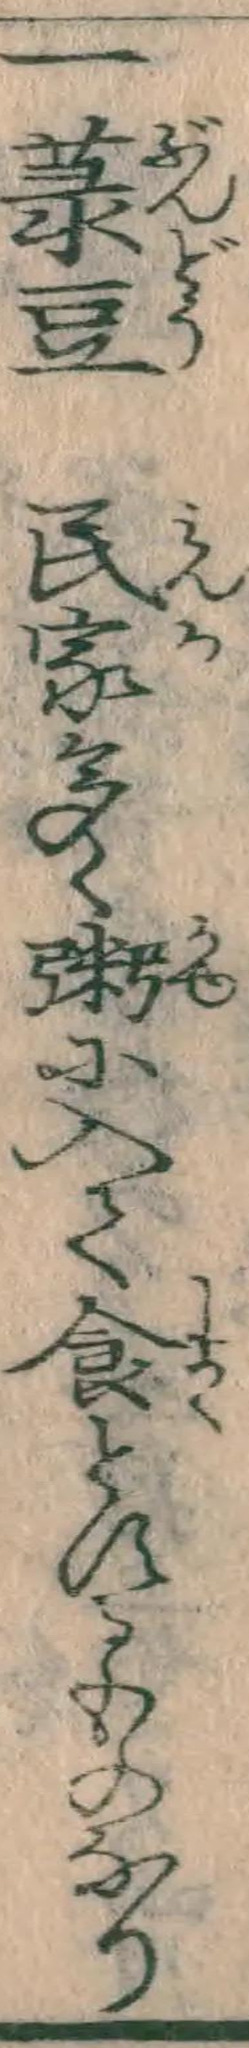一菉豆民家多く粥に入て食とするものなり
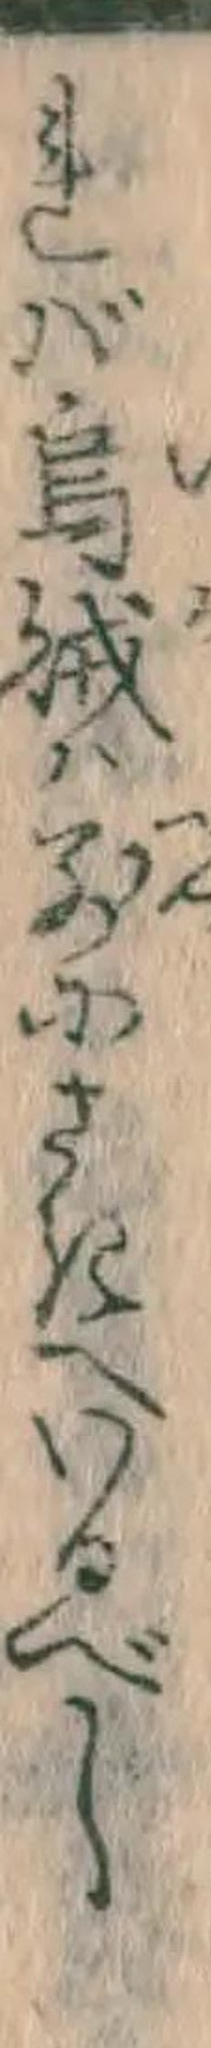れば烏賊は別にさきへいるべし
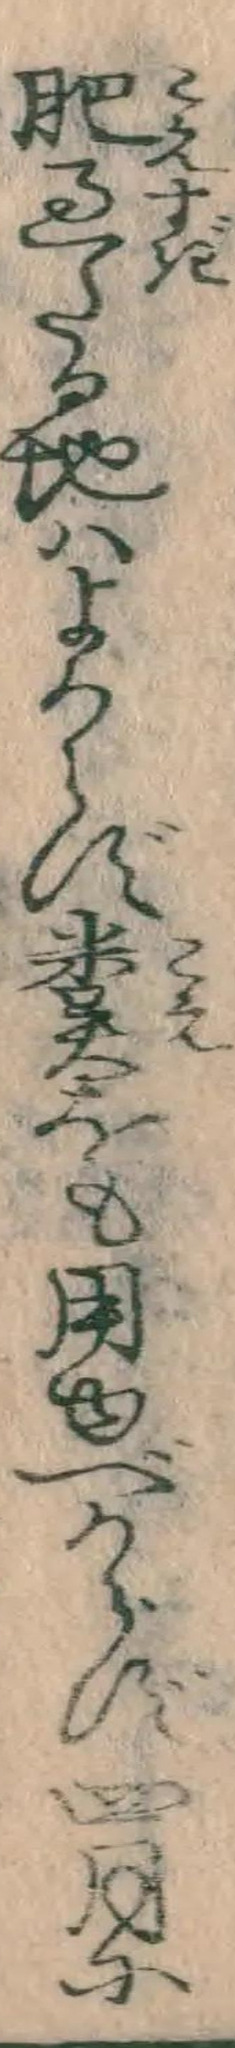肥過たる地はよからず糞をも用ゆべからず四月に
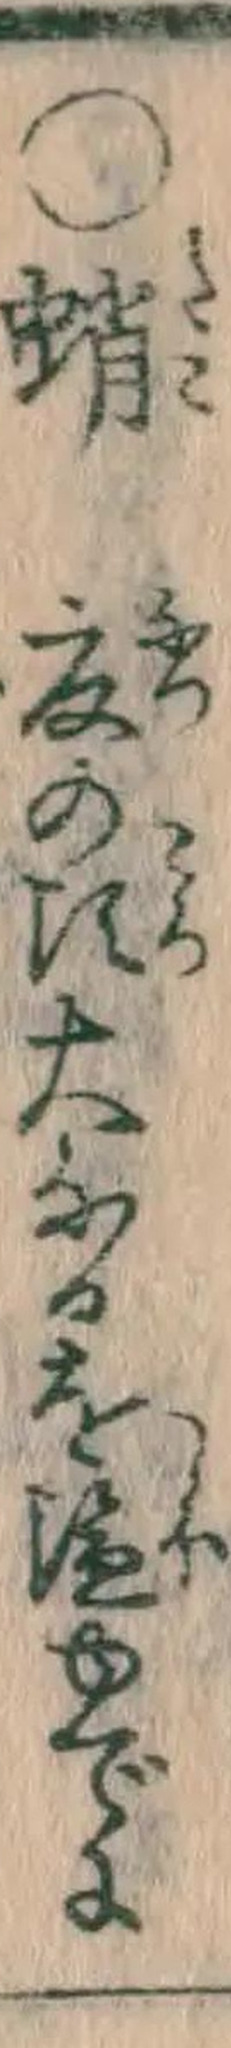○蛸夏の頃大なるを塩ゆでに
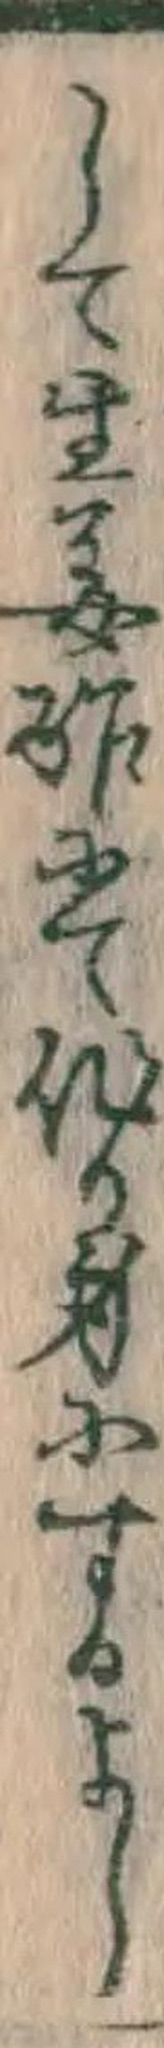して生姜酢にて作り身にするよし
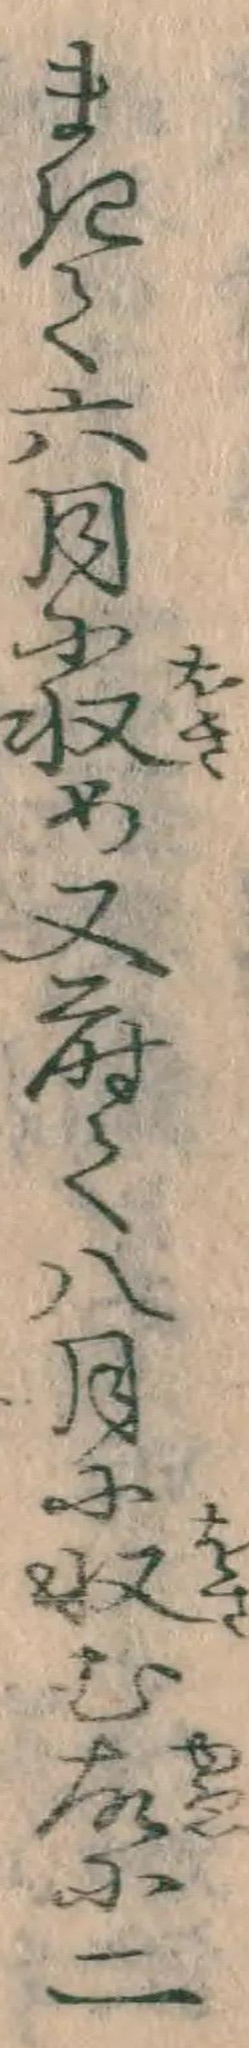まきて六月に収め又蒔て八月に収む故に二
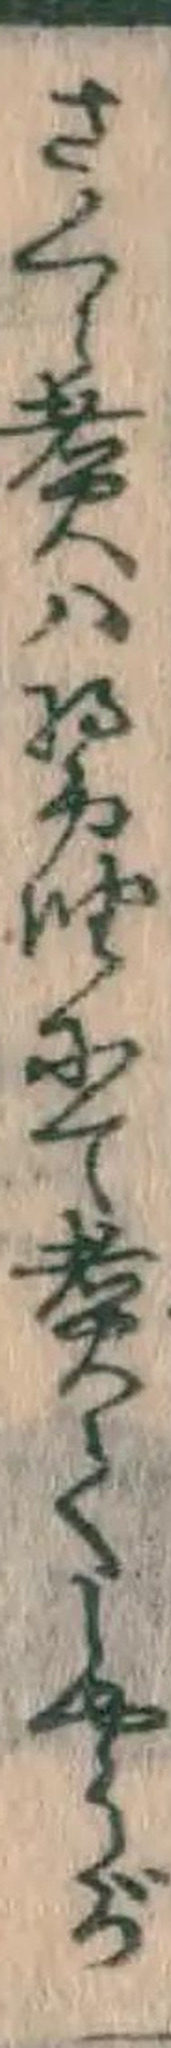さくら煮は醬油にて煮てしやうが
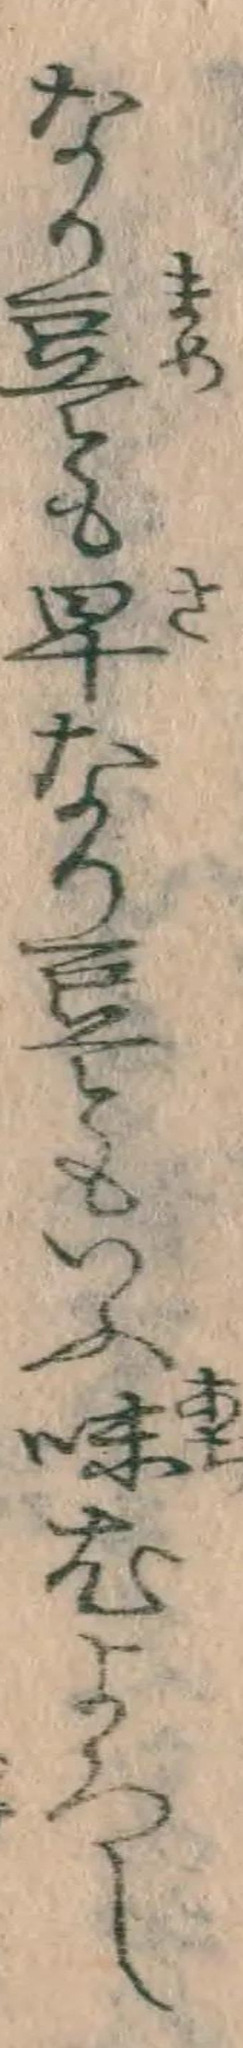なり豆とも早なり豆ともいふ味尤よろし
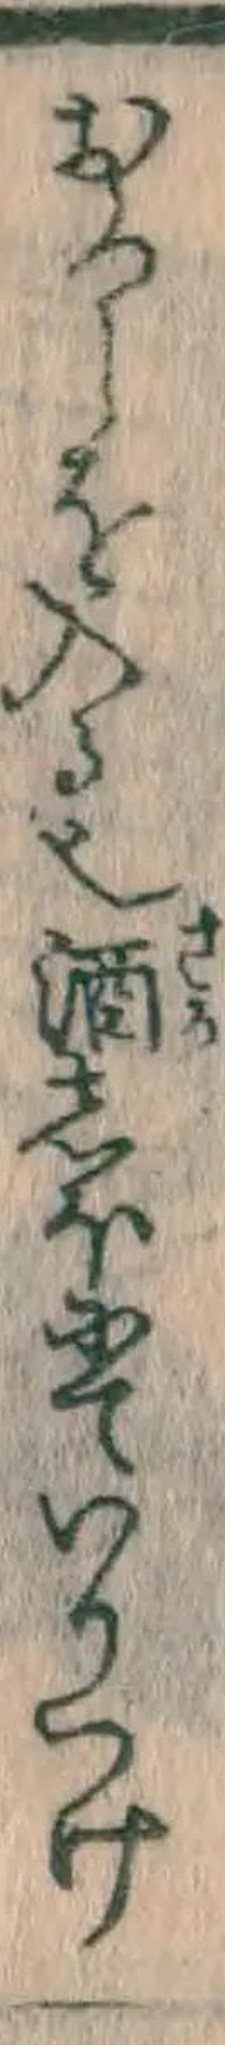おろしを入る也酒しほにていりつけ
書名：広益秘事大全 3巻. [5]
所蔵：国立国会図書館 National Diet Library, JAPAN
